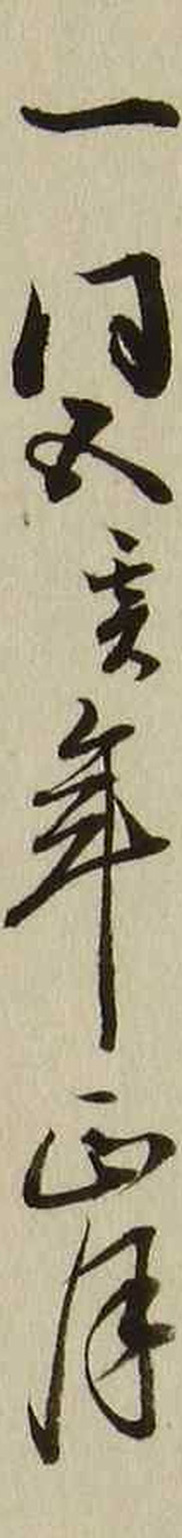一同五亥年正月
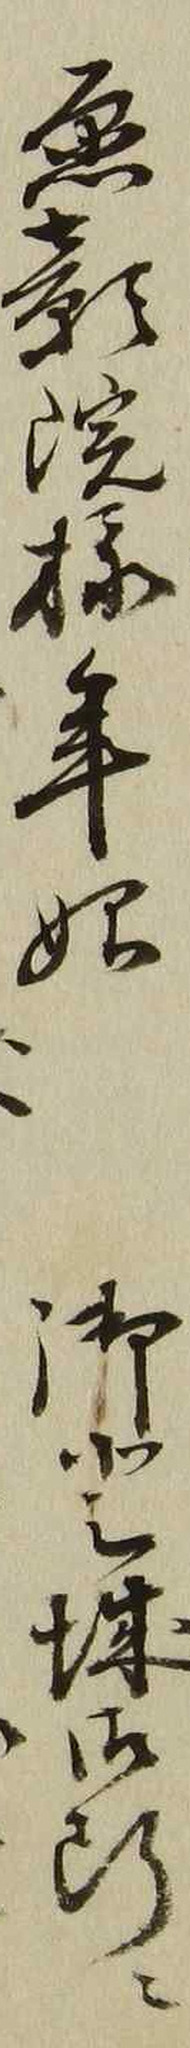愿彰院様年始御登城御断ニ
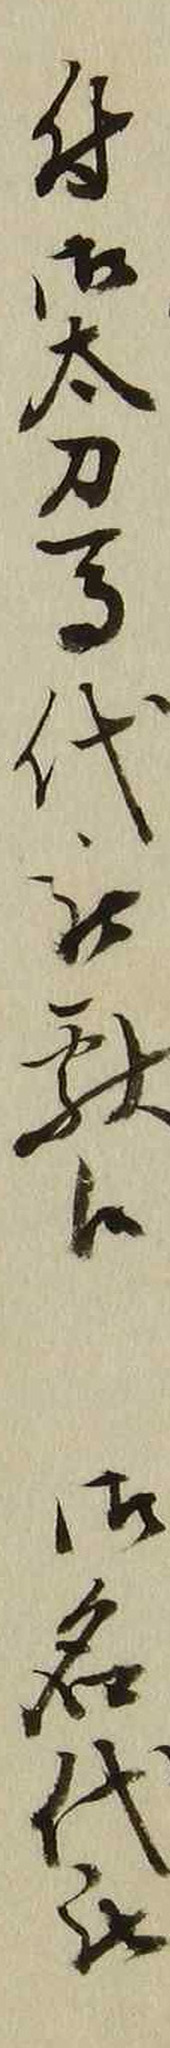付御太刀馬代被献候御名代被
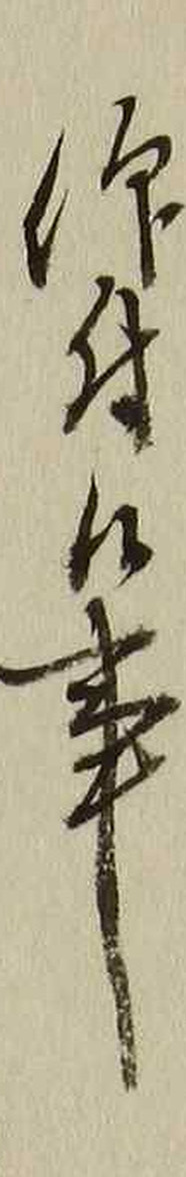仰付候事
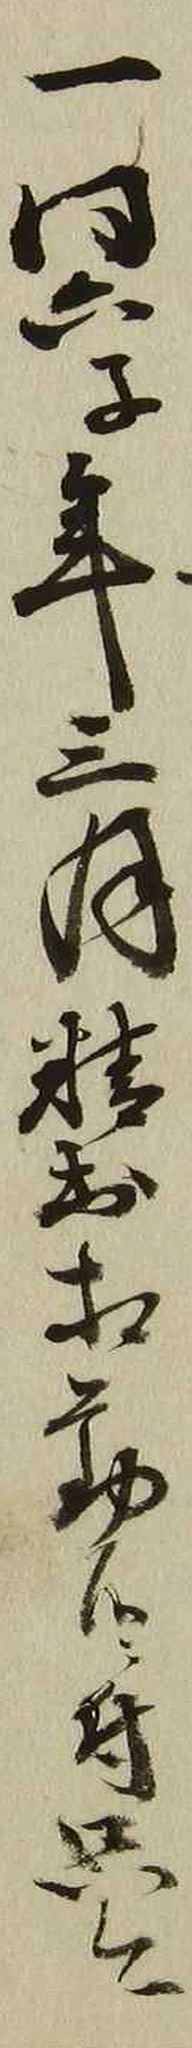一同六子年三月精出相勤候付ニ只今
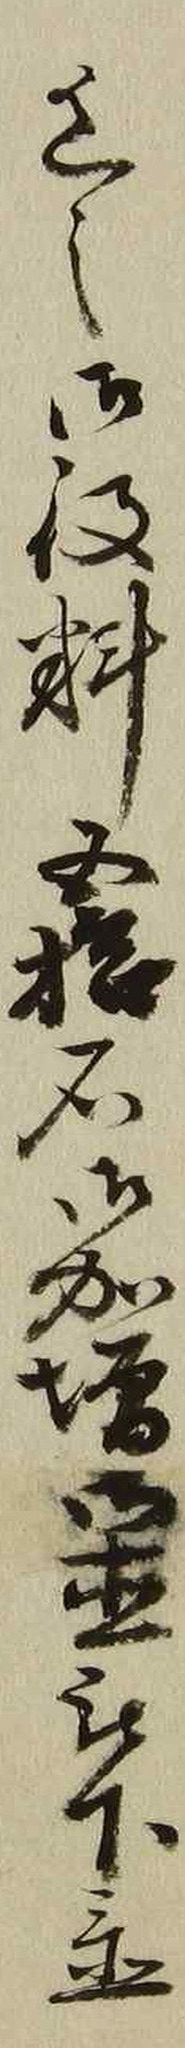迄之御役料五拾石御加増御直被下置
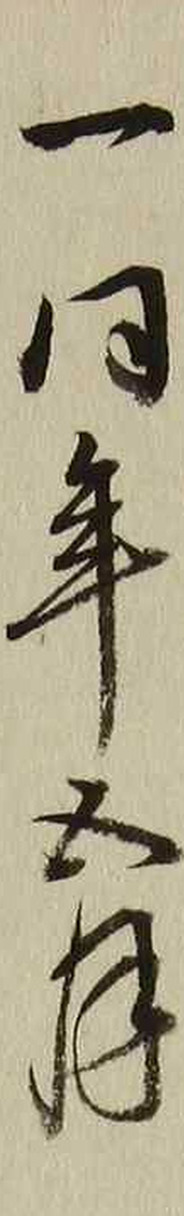一同年五月
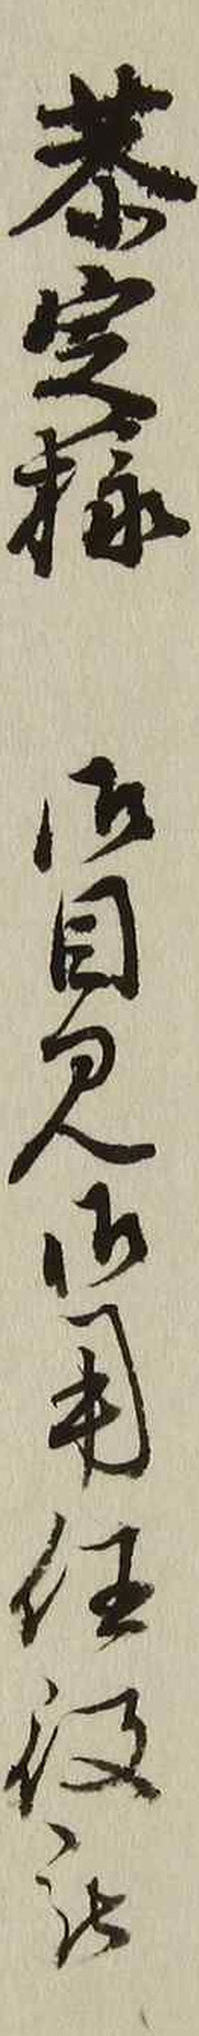茶定様御目見御用任役被
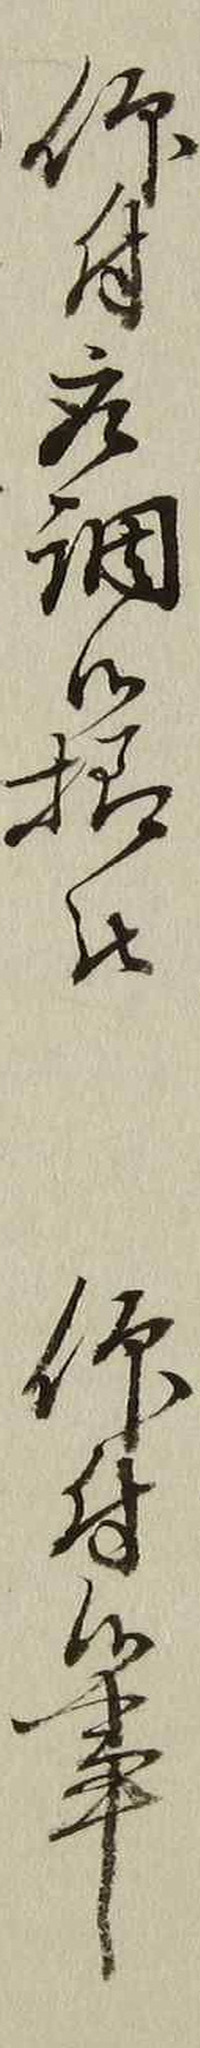仰付取調候様被仰付候事
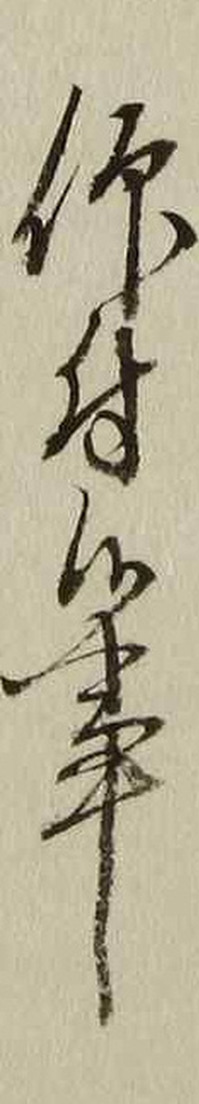仰付候事
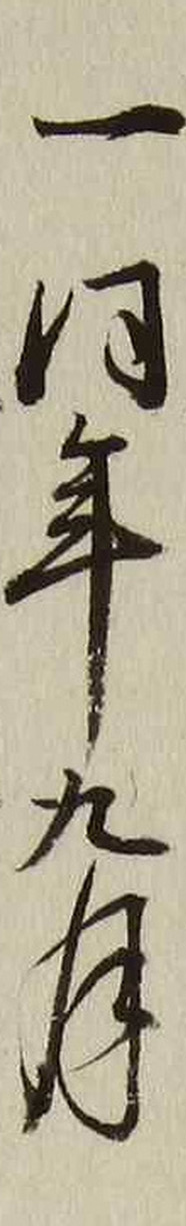一同年九月
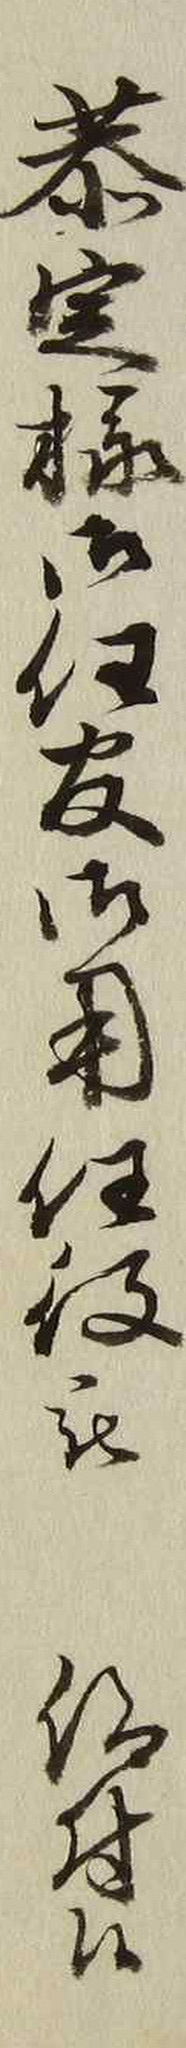恭定様御任官御用任役被仰付候
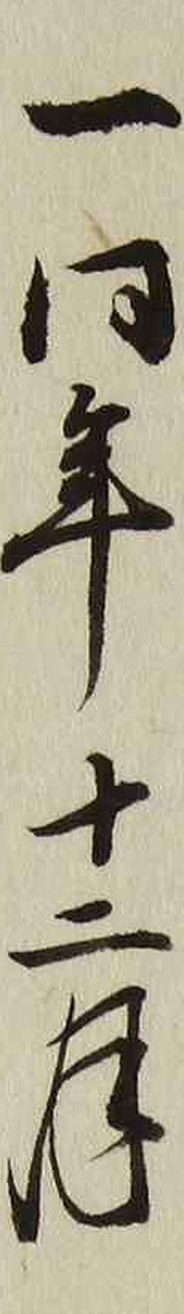一同年十二月
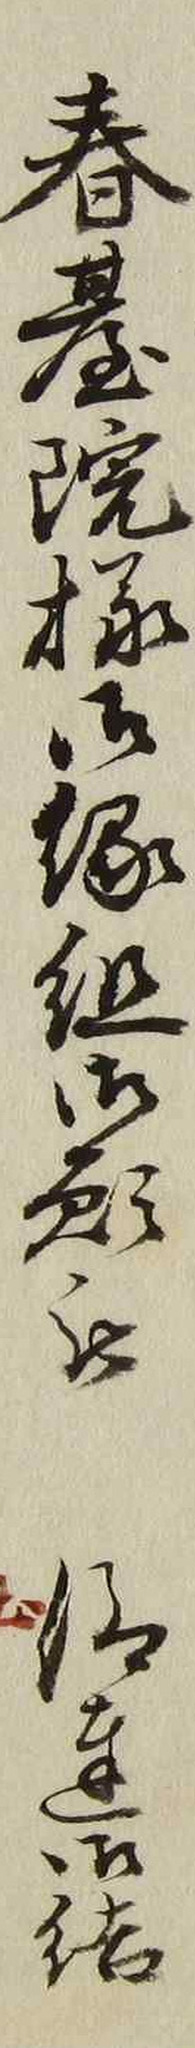春台院様御縁組御願被仰達御結
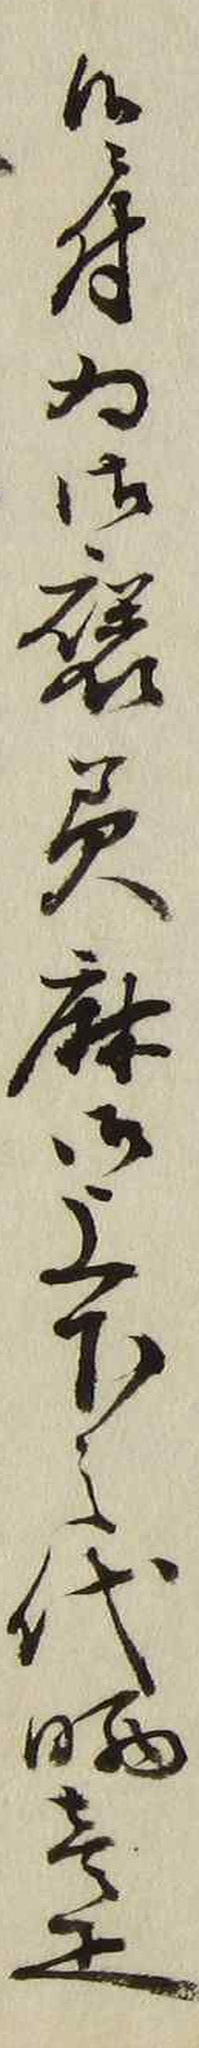候ニ付為御褒美麻御上下之代晒壱疋
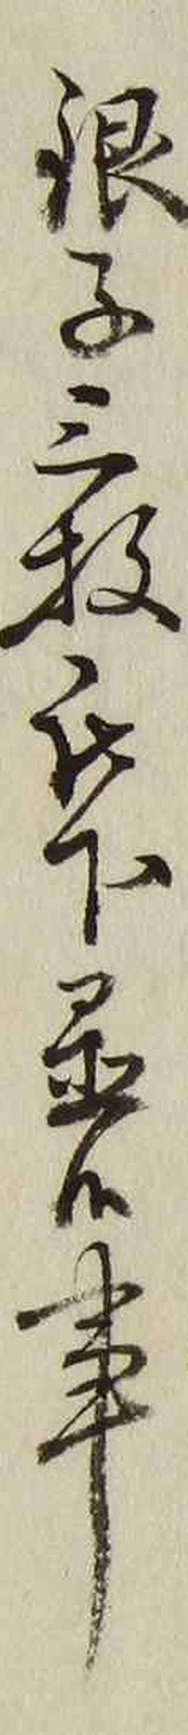銀子三枚被下置候事
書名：諸士系譜　巻之35　は之部3
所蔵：会津若松市立会津図書館
